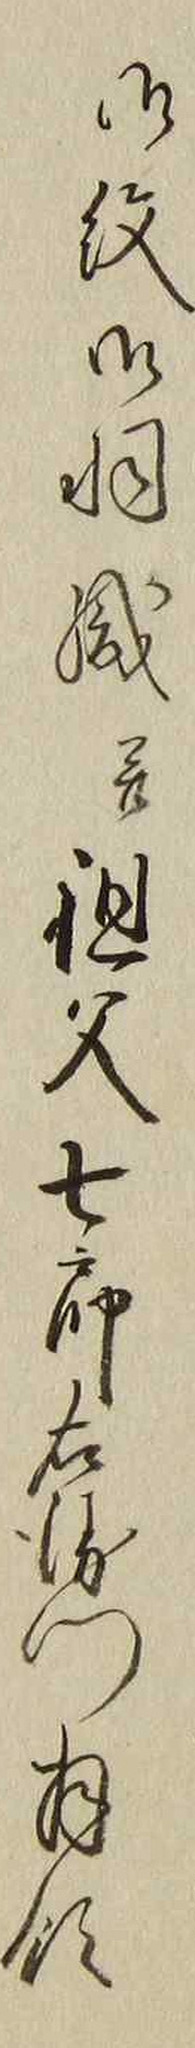御紋御羽織幷祖父七郎右衛門拝領
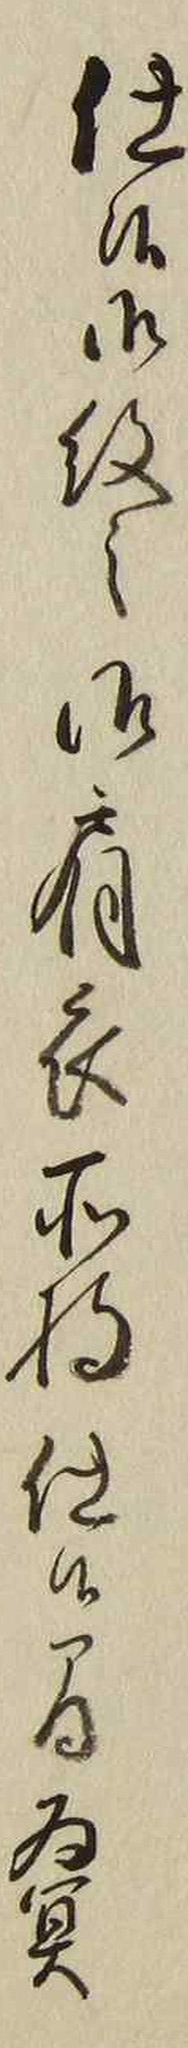仕候御紋の御肩衣所持仕候間為冥

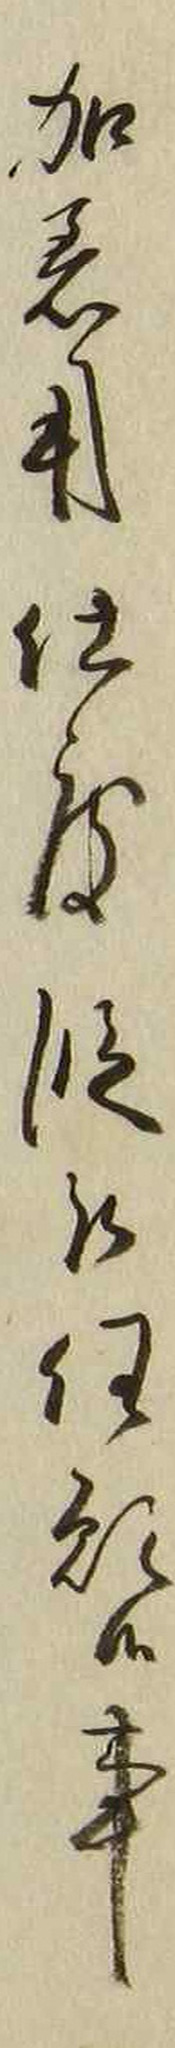加着用仕度段被任願候事
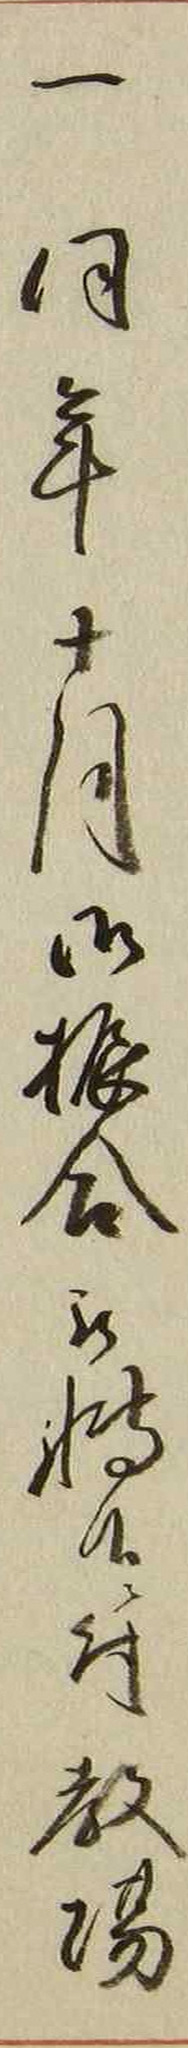一同年十月御振合被転候に付教場
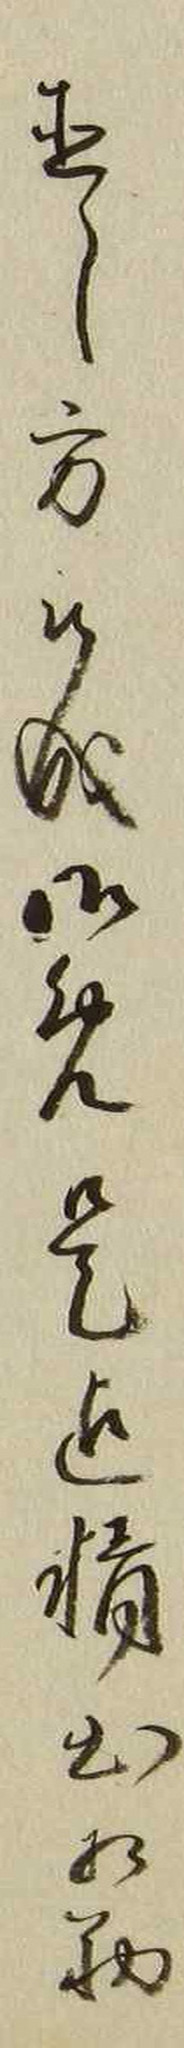置し方被成御免是迄精出相勤
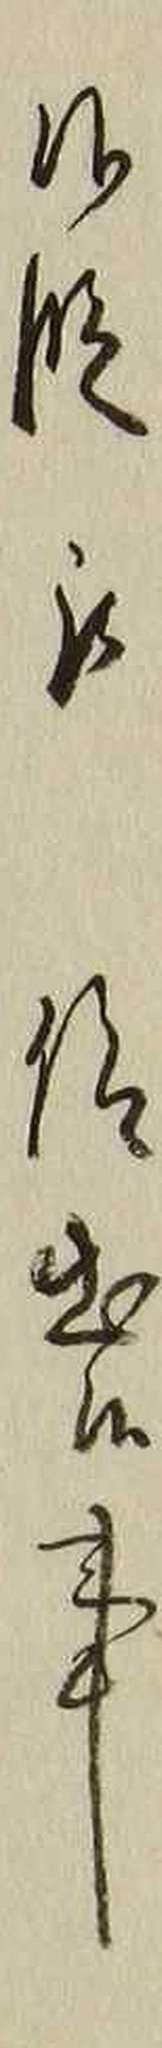候段被仰出候事
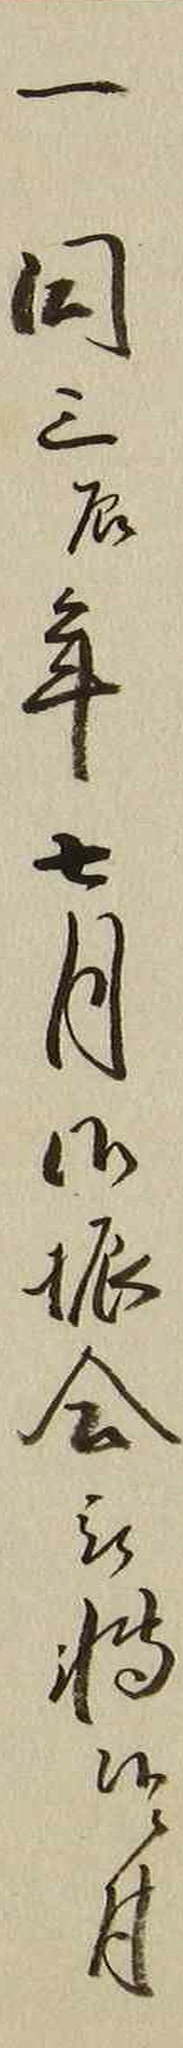一同年七月御振合被転候に付
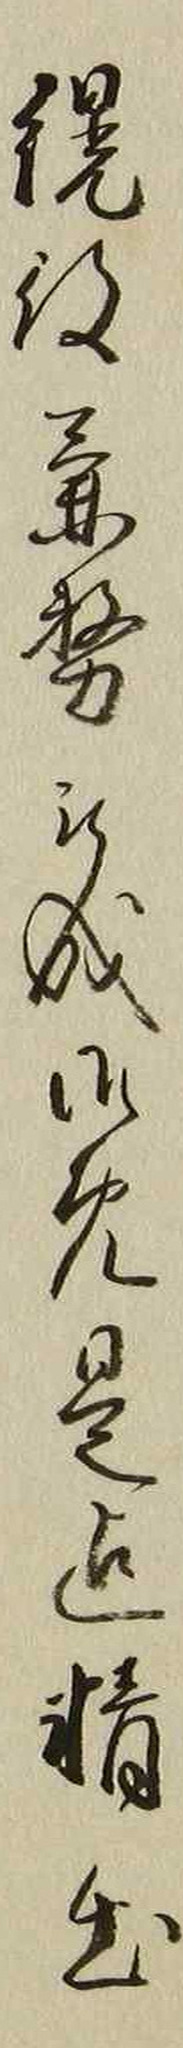幌役兼務被成御免是迄精出
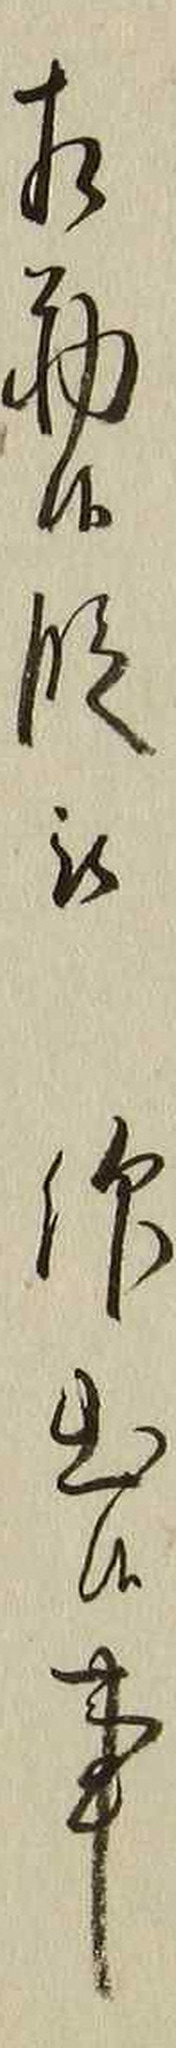相勤候段被仰出候事
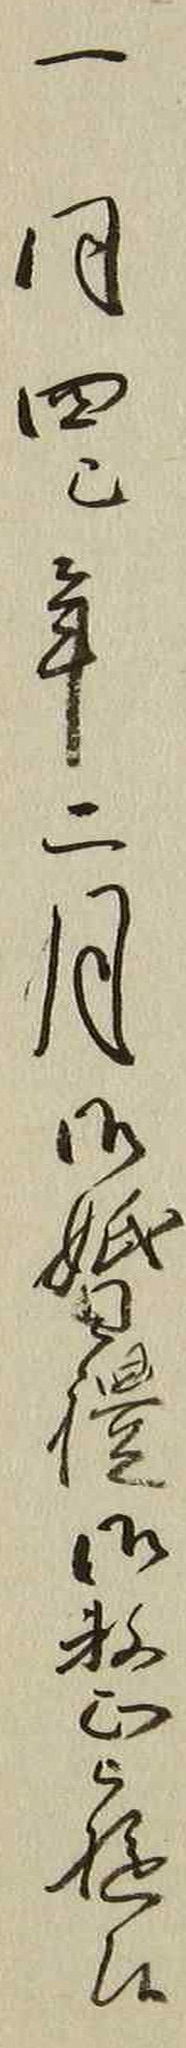一同四巳年二月御婚礼御整被遊候
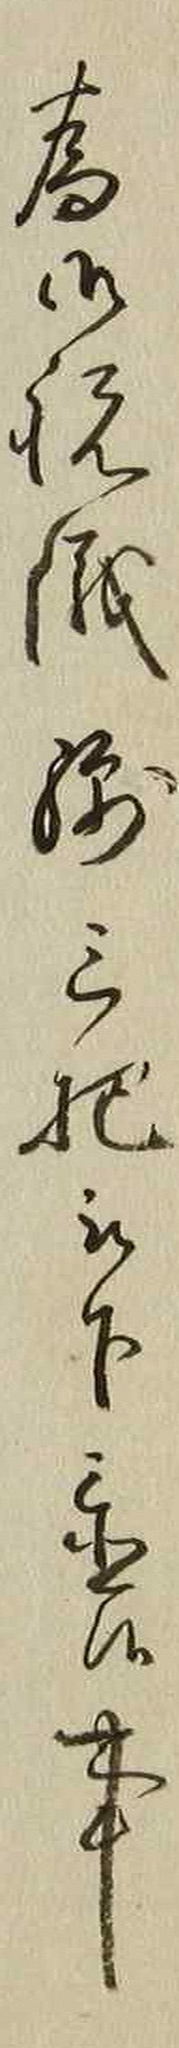為御祝儀綿三把被下置候事
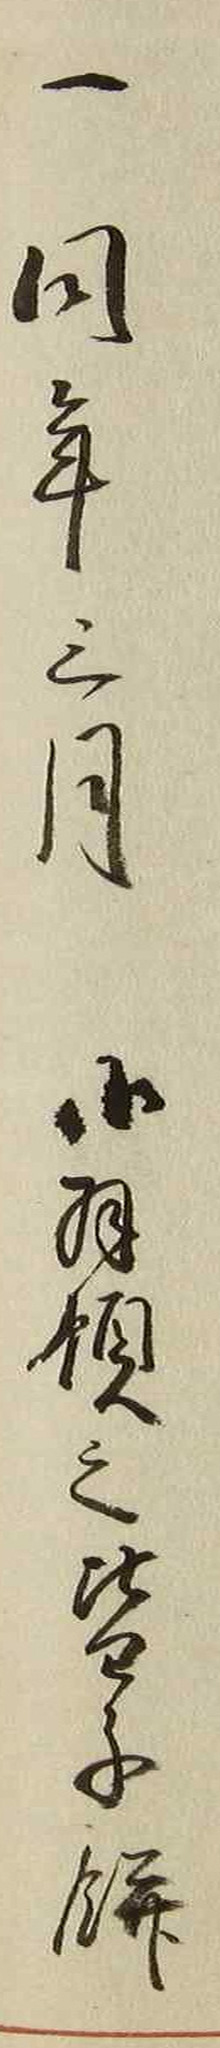一同年三月御拝領の皆子餅
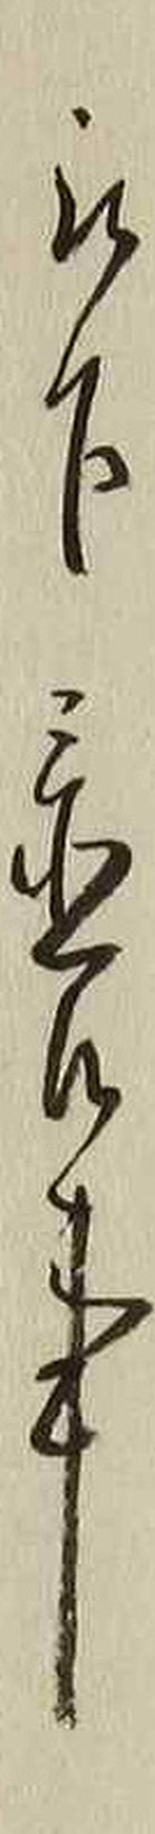被下置候事
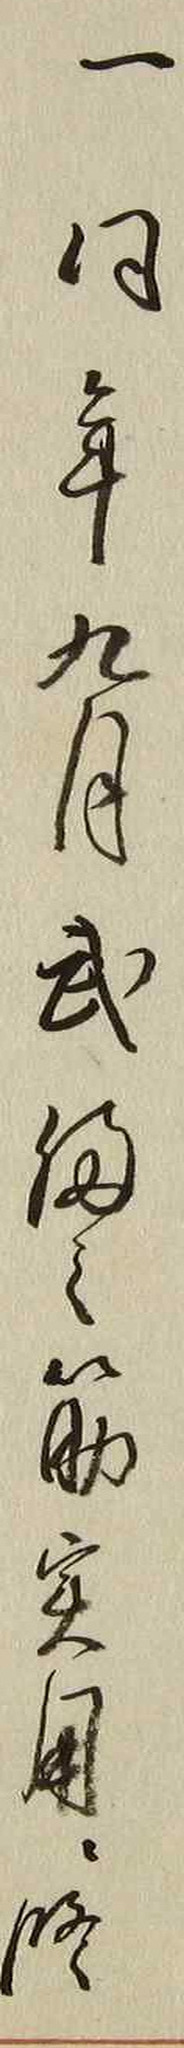一同年九月武備の筋実用に修
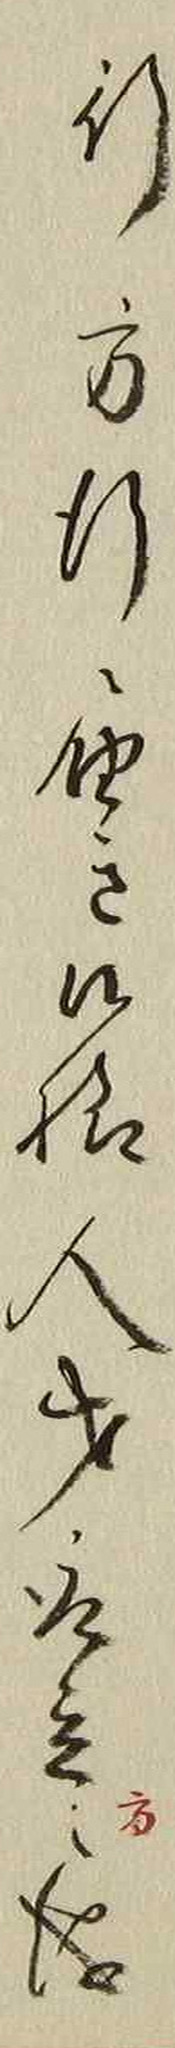行方行届き候様人才取立の儀
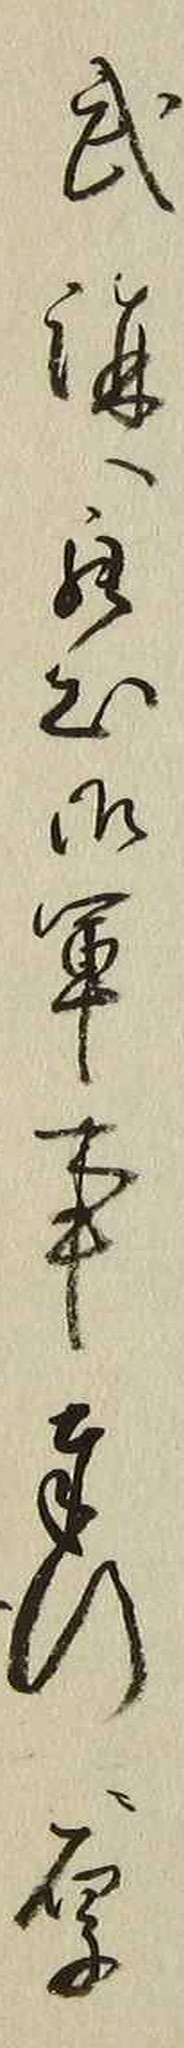武講へ罷出御軍事奉行に厚
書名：諸士系譜　巻之1　い之部1
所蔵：会津若松市立会津図書館
